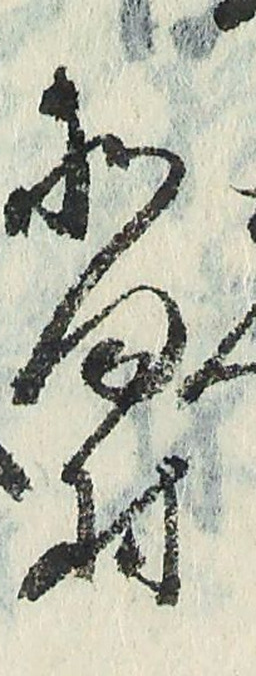和田村
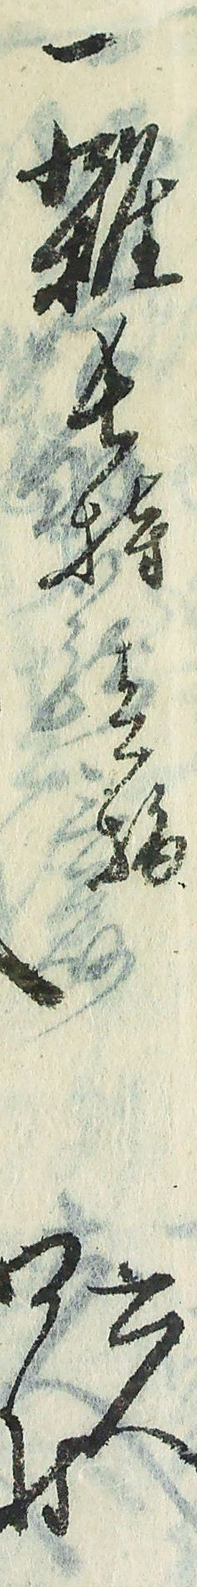一雑長持壱指六人
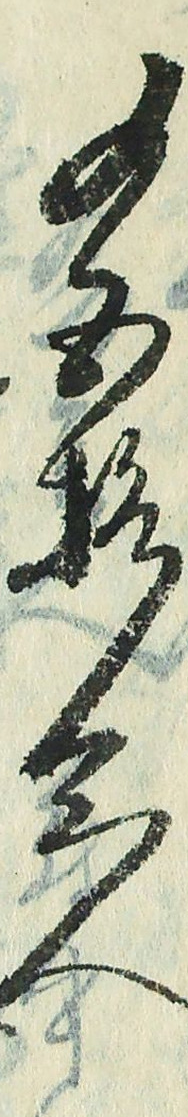〆五拾三人
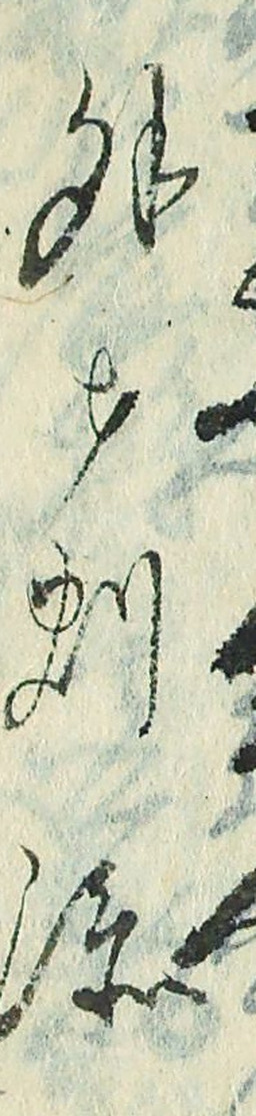外才判添
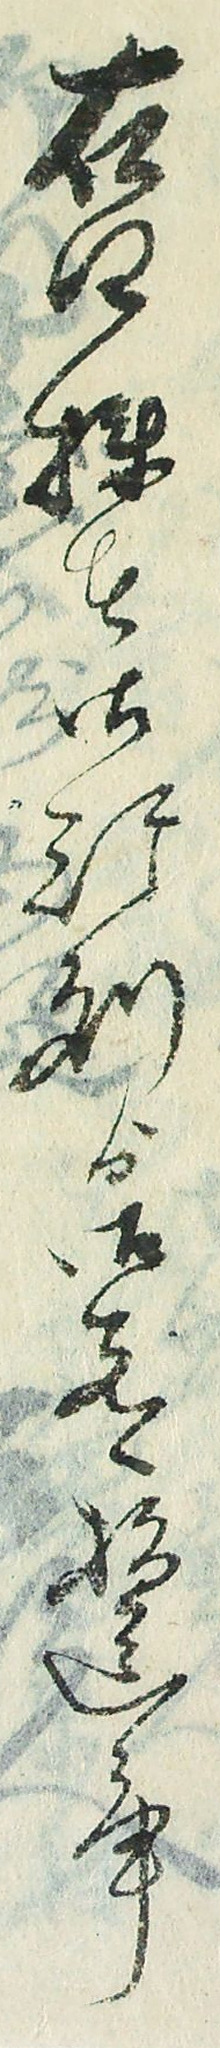右四株は御行列ゟ御先へ指送候事
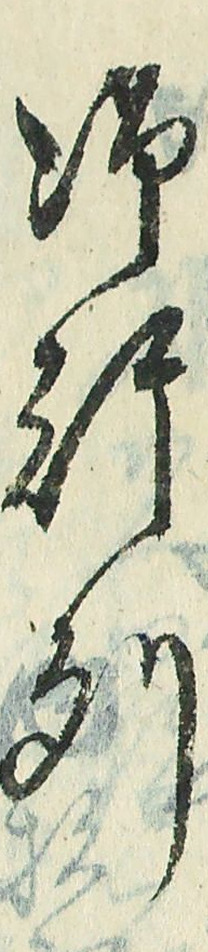御行列
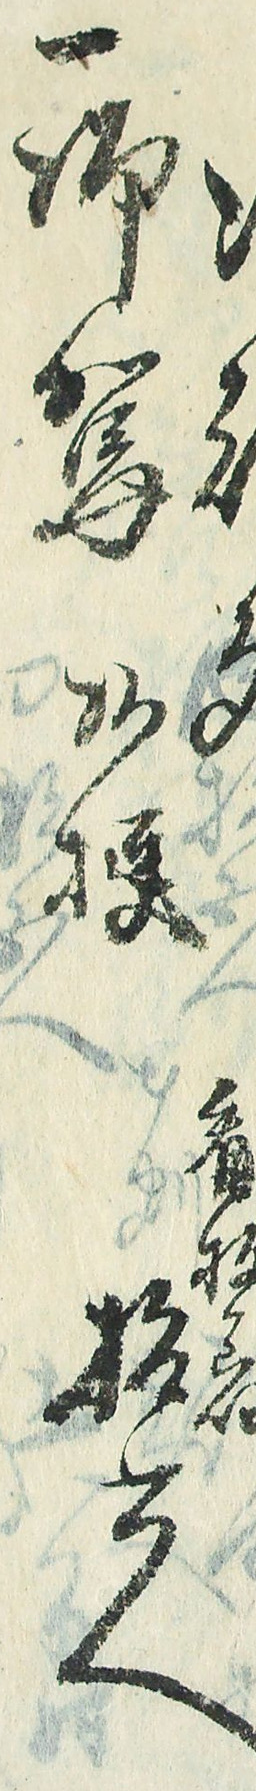一御駕弐挺拾六人

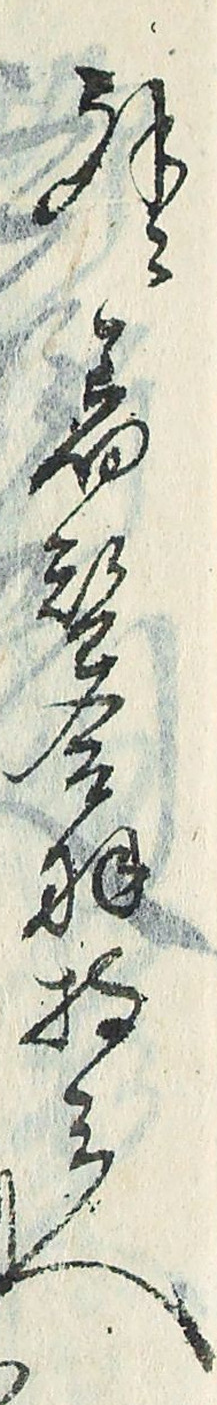外に着替合羽持三人
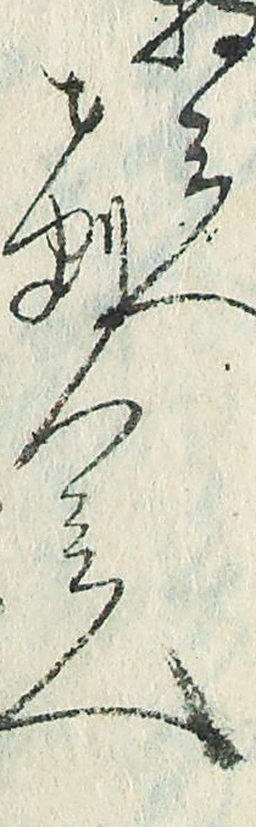才判人壱人
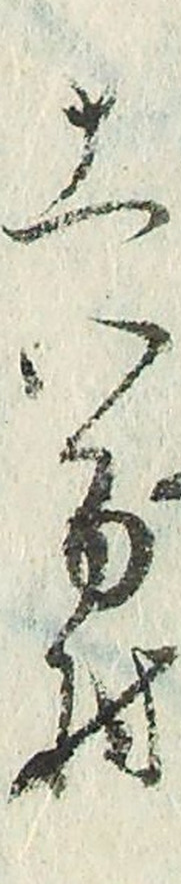上八万村
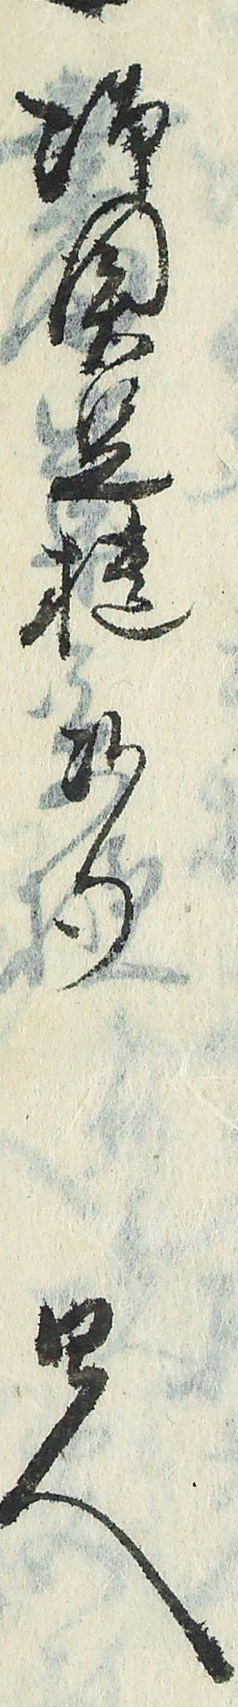一御具足櫃弐つ四人
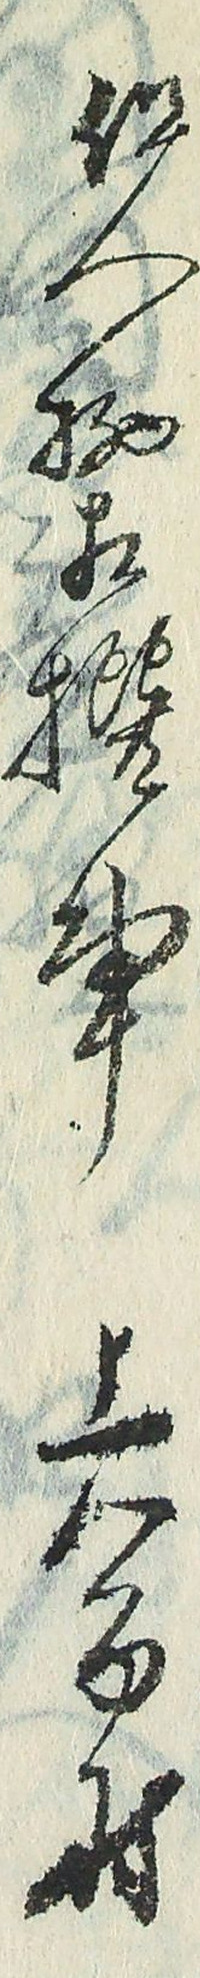但人柄相撰事上八万村
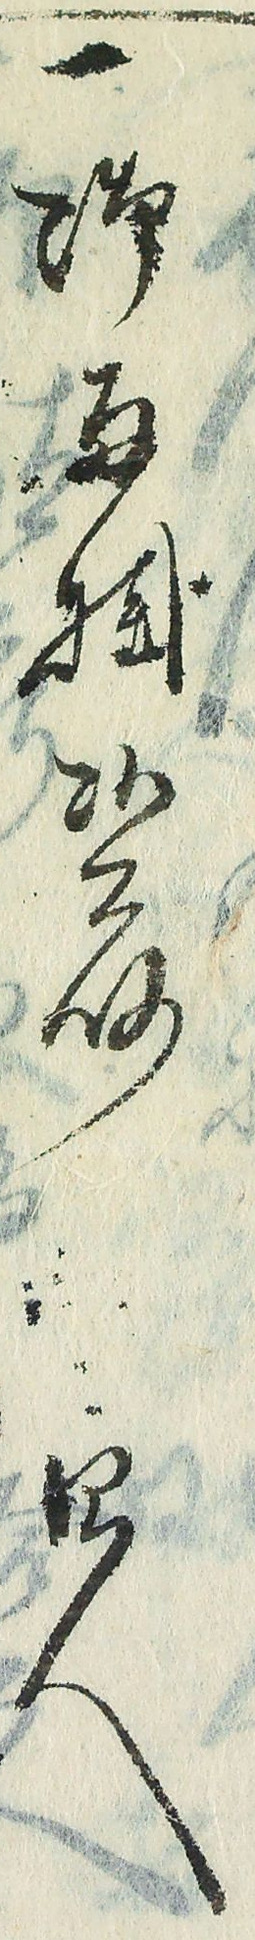一御両掛弐荷四人
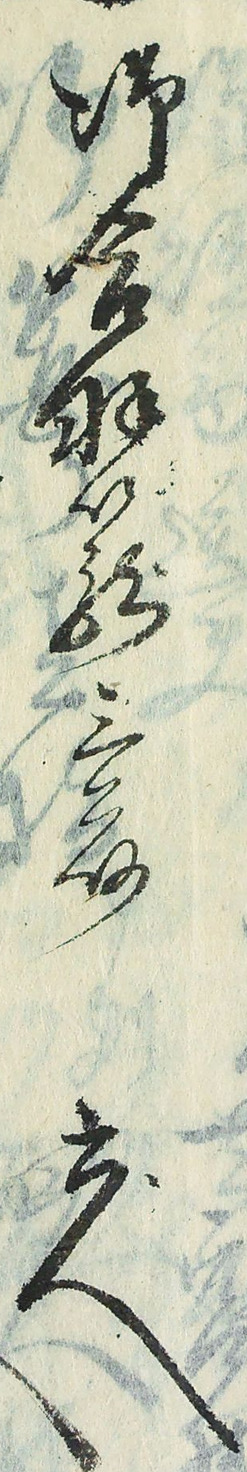一御合羽籠三荷六人
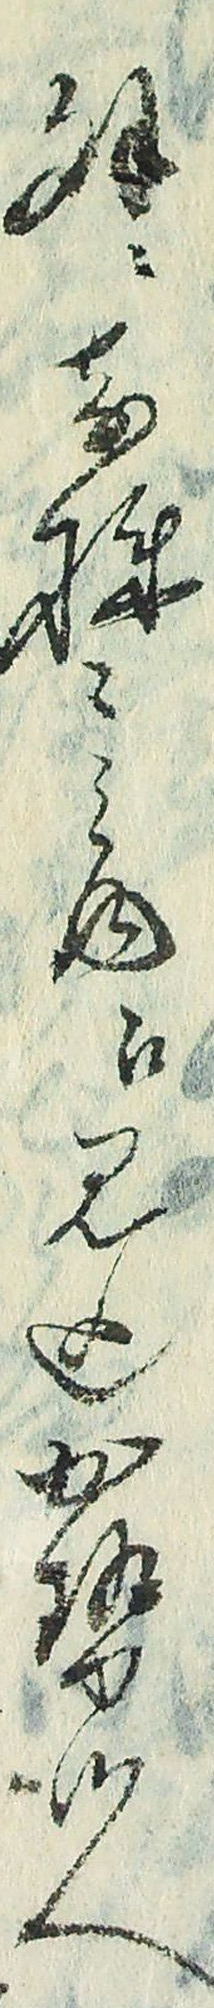外に前株々之内え見込加勢弐人
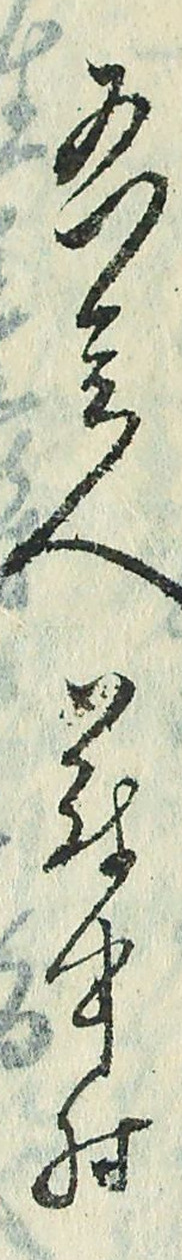右壱人府中村同村
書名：公辺御役人為御廻浦御立越諸御用一巻
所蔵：鳴門教育大学 Naruto University of Education
